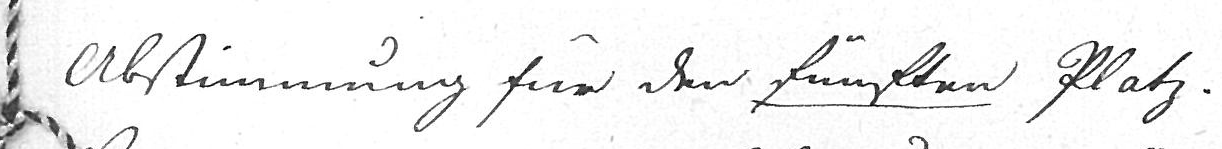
Abstimmung für den fünften Platz.
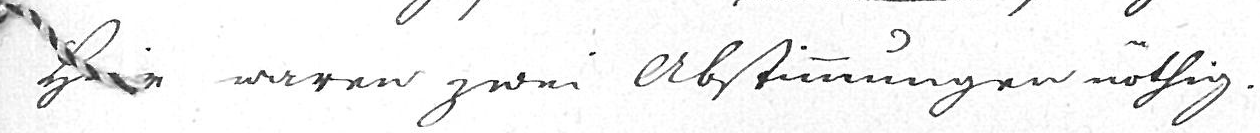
Hier waren zwei Abstimmungen nöthig.
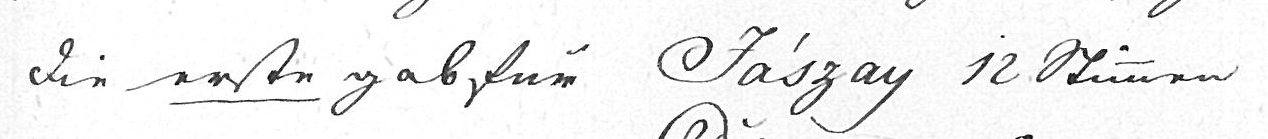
Die erste gab für Jászay 12 Stimmen
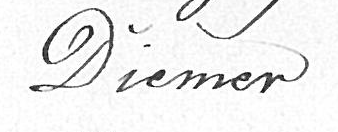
Diemer 8 "
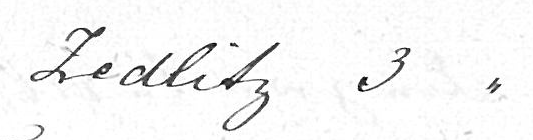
Zedlitz 3 "
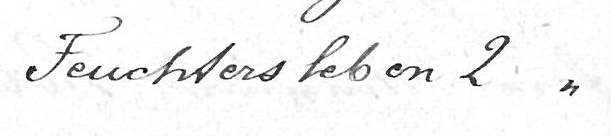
Feuchtersleben 2 "
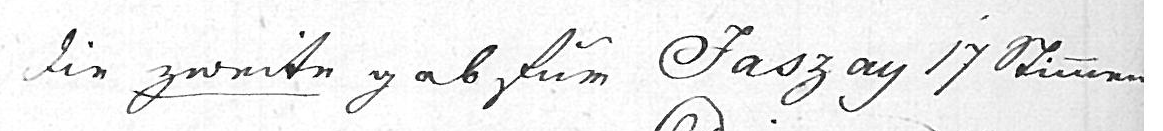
Die zweite gab für Jaszy 17 Stimmen
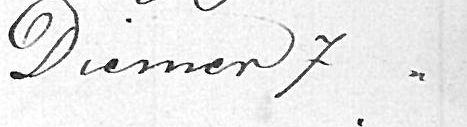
Diemer 7 "
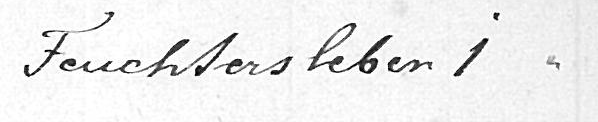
Feuchtersleben 1 "
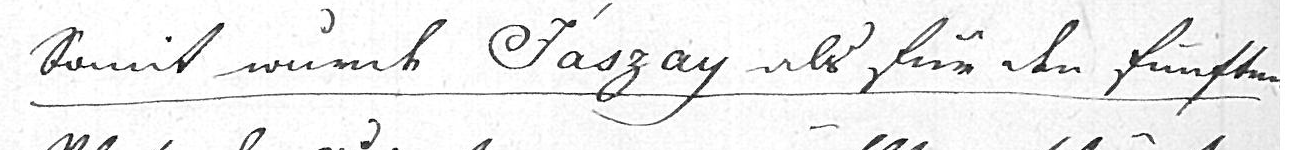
Smit wurde Jászy als für den fünften
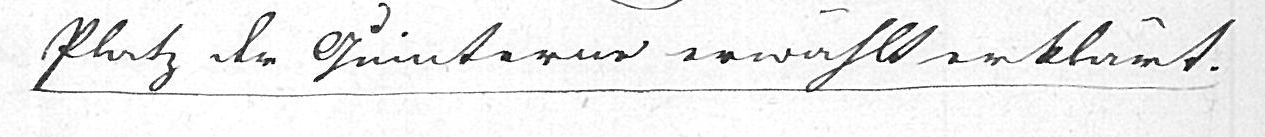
Platz der Quinterne erwählt erklärt.
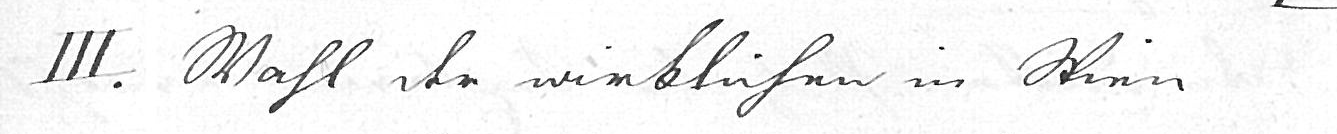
III. Wahl der wirklichen in Wien
